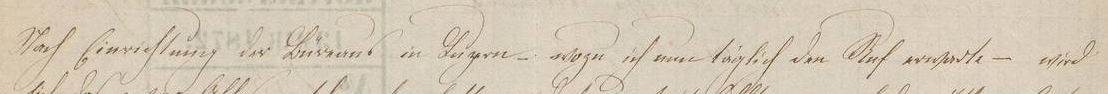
Nach Einrichtung der Büreaus in Luzern – wozu ich nun täglich den Ruf erwarte – wird
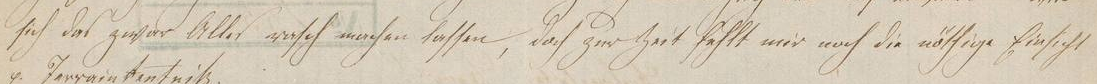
sich das zwar Alles rasch machen lassen, doch zur Zeit fehlt mir noch die nöthige Einsicht
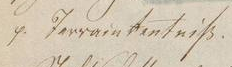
& Terrainkenntniß.
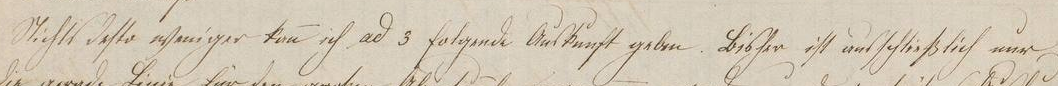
Nichts desto weniger kann ich ad 3 folgende Auskunft geben. Bisher ist ausschließlich nur
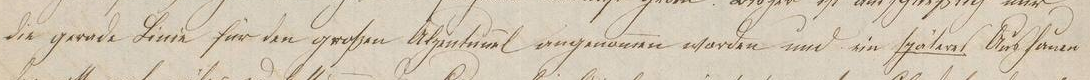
die gerade Linie für den großen Alpentunnel angenommen worden und ein späteres Aushauen
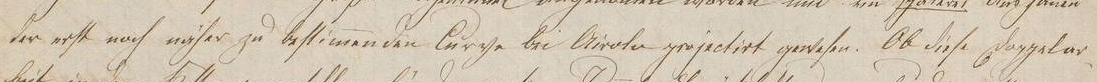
der erst noch näher zu bestimmenden Curve bei Airolo projectirt gewesen. Ob diese Doppelar-
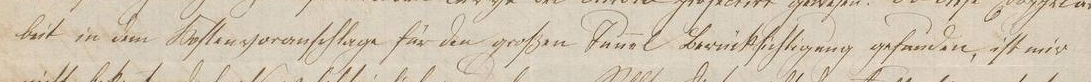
beit in dem Kostenvoranschlage für den großen Tunnel Berücksichtigung gefunden, ist mir
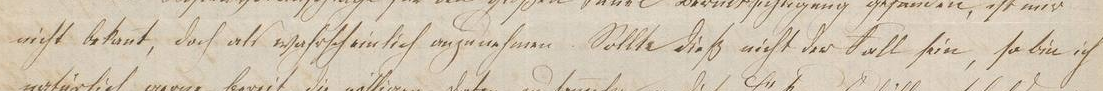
nicht bekannt, doch als wahrscheinlich anzunehmen. Sollte dieß nicht der Fall sein, so bin ich
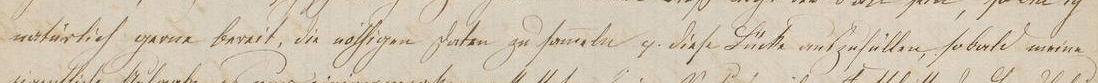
natürlich gerne bereit, die nöthigen Daten zu sammeln & diese Lücke auszufüllen, so bald meine
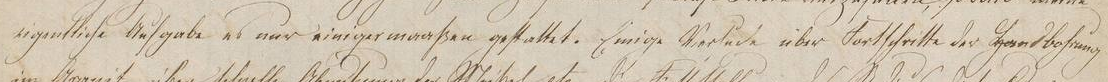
eigentliche Aufgabe es nur einigermaaßen gestattet. Einige Versuche über Fortschritte der Handbohrung
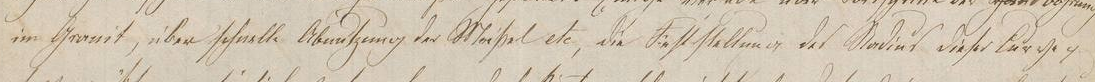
im Granit, über schnelle Abnutzung der Meißel etc, die Feststellung des Radius dieser Curve &
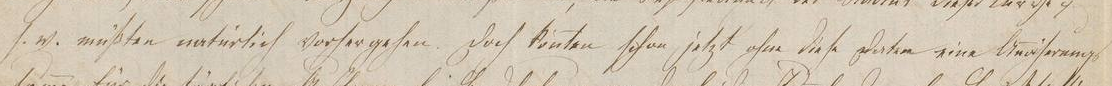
s. w. müßten natürlich vorhergehen. Doch könnten schon jetzt ohne diese Daten eine Annäherungs-
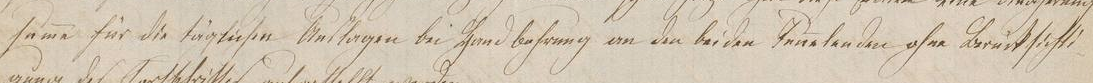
summe für die täglichen Auslagen bei Handbohrung an den beiden Tunnelenden ohne Berücksichti-
